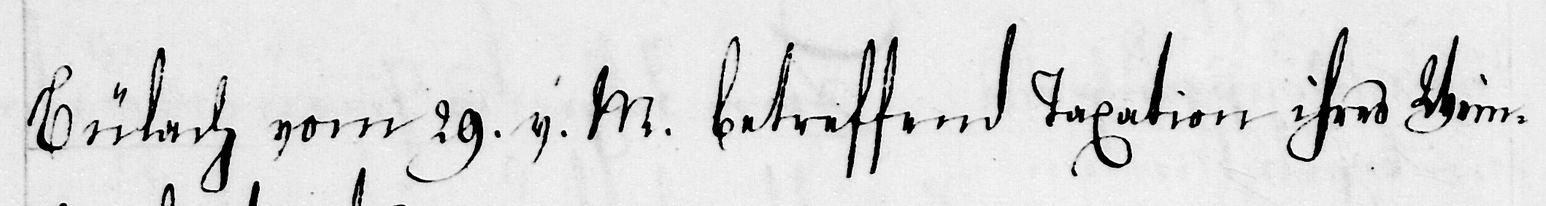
Bülach vom 29. v. M. betreffend Taxation ihres Wein¬
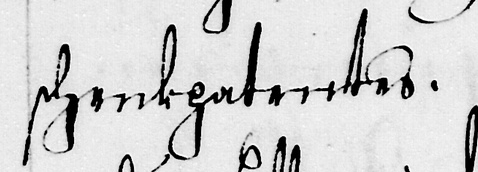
schenkpatentes.
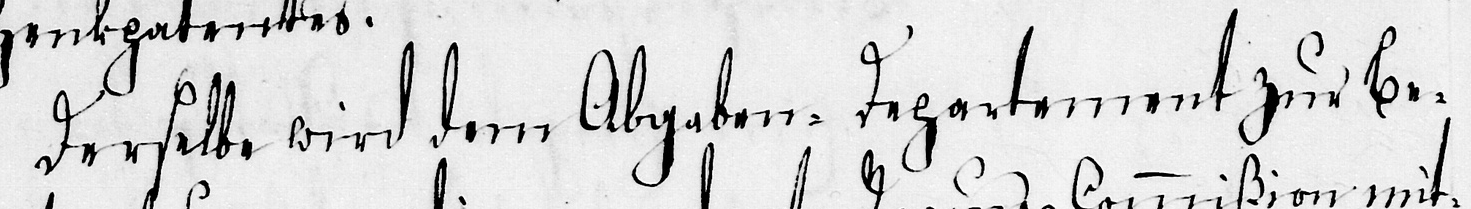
Derselbe wird dem Abgaben-Departement zur Be¬
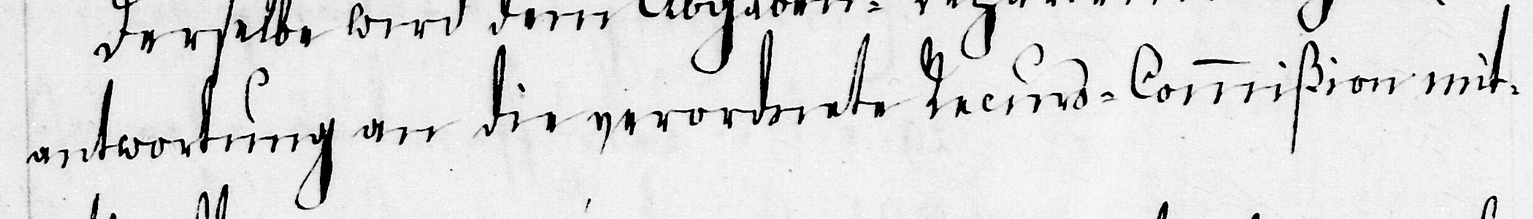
antwortung an die verordnete Recurs-Commißion mit¬
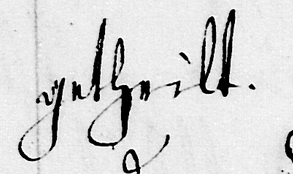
getheilt.
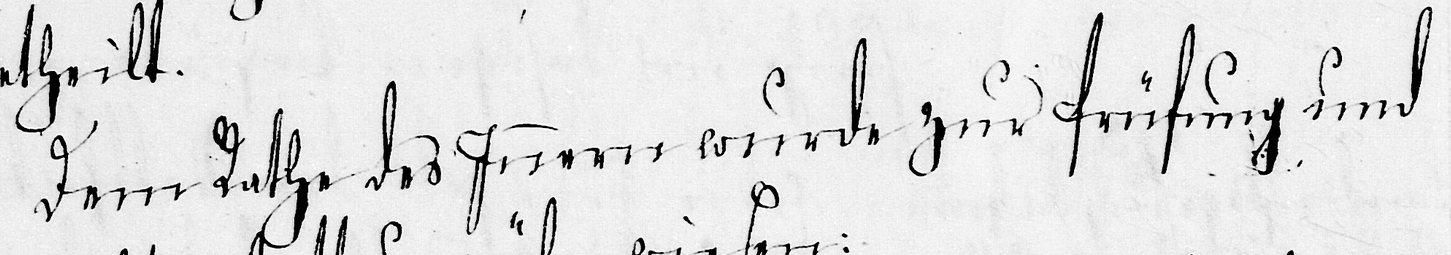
Dem Rathe des Innern wurde zur Prüfung und
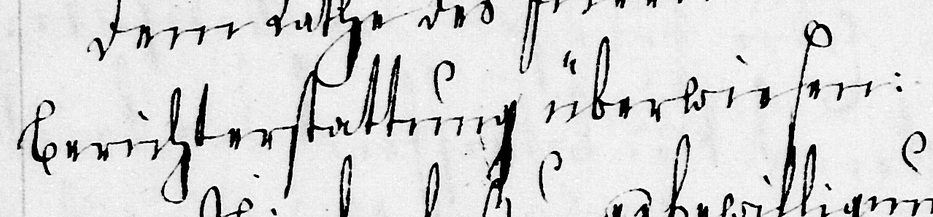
Berichterstattung überwiesen:
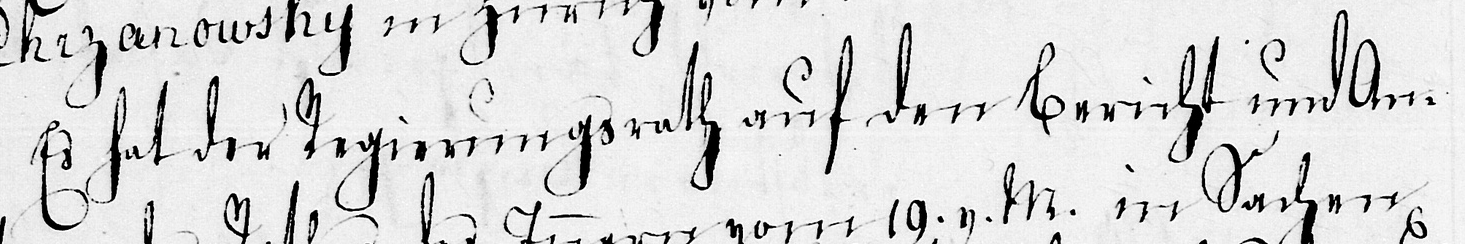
Es hat der Regierungsrath auf den Bericht und An¬
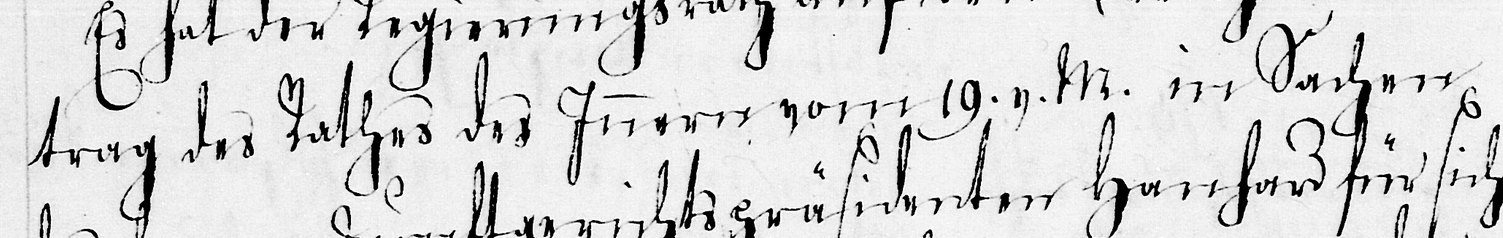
trag des Rathes des Innern vom 19. v. M. in Sachen
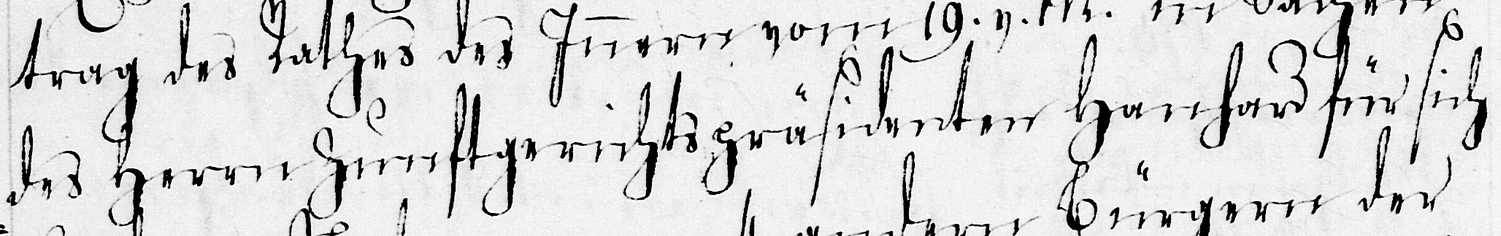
des Herrn Zunftgerichtspräsidenten Hanhard für sich
